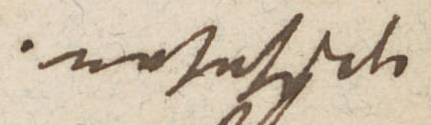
und in den meisten Fällen
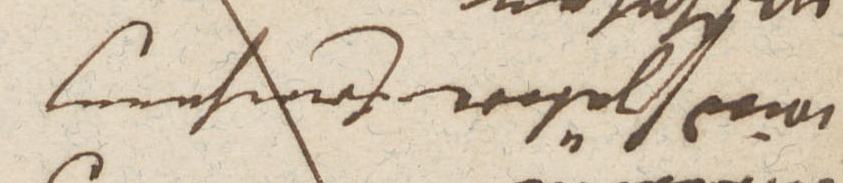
sich annähernder Grund-
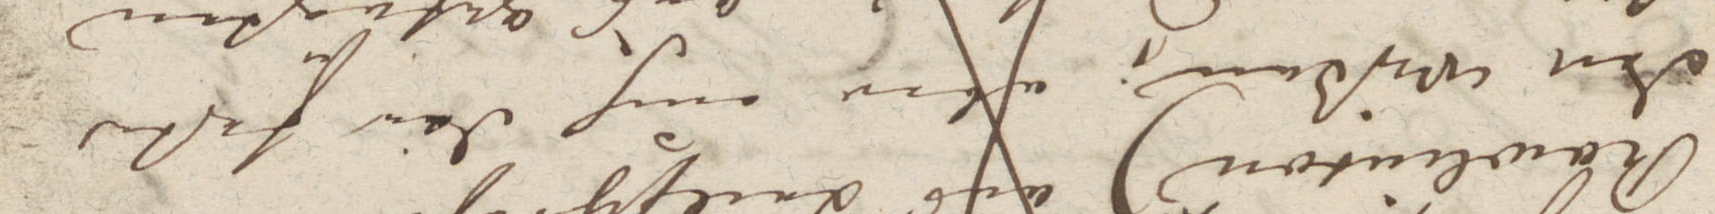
tragen, wie wir diess aus bestimmten
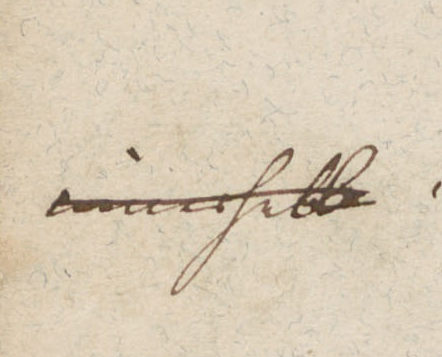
geschehen.
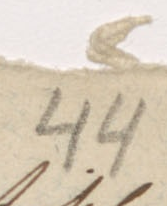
179.
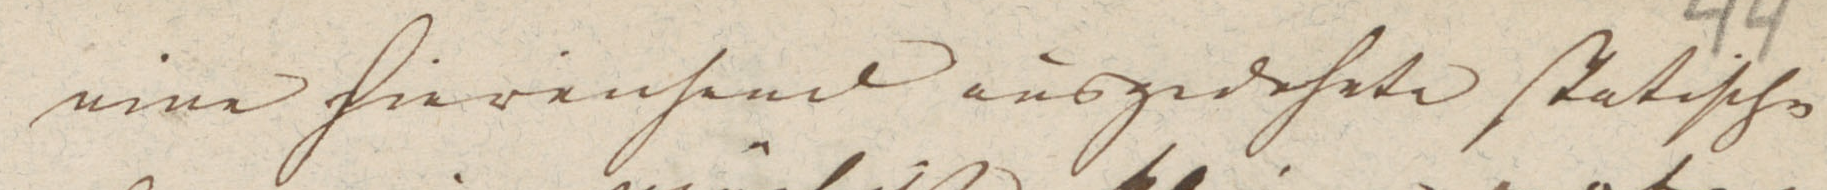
eine hinreichend ausgedehnte statische
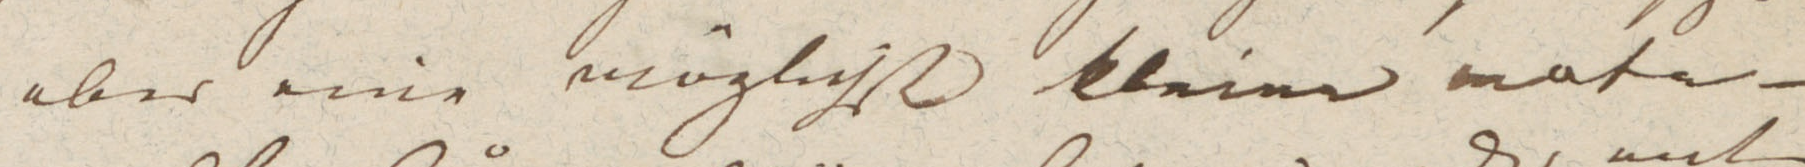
aber eine möglichst kleine mate-
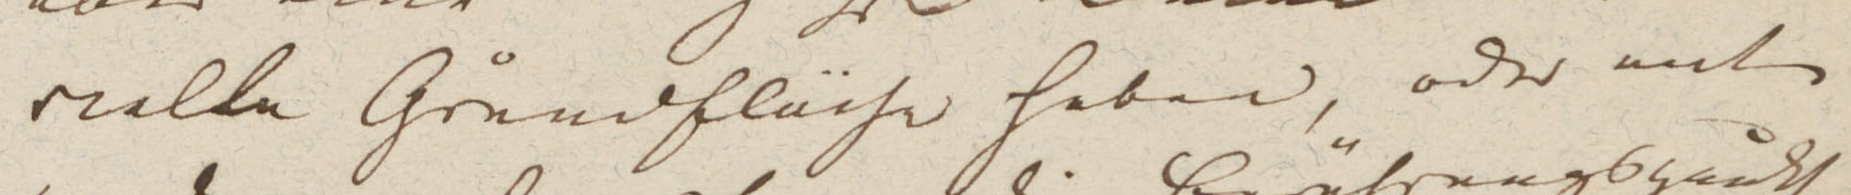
rielle Grundfläche haben, oder mit
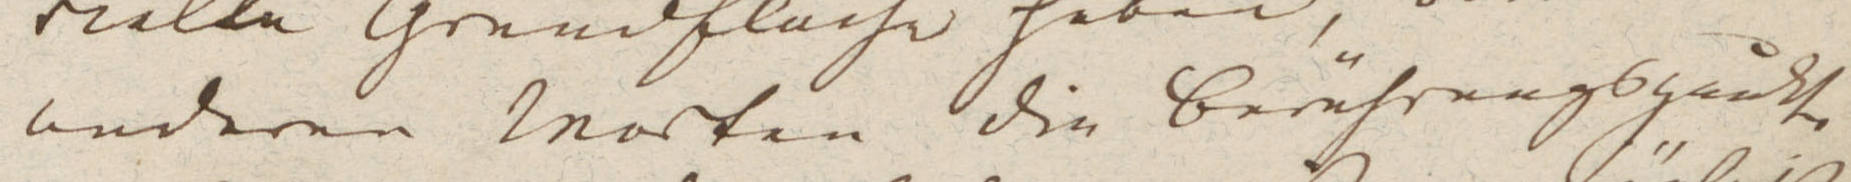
anderen Worten die Berührungspunkte
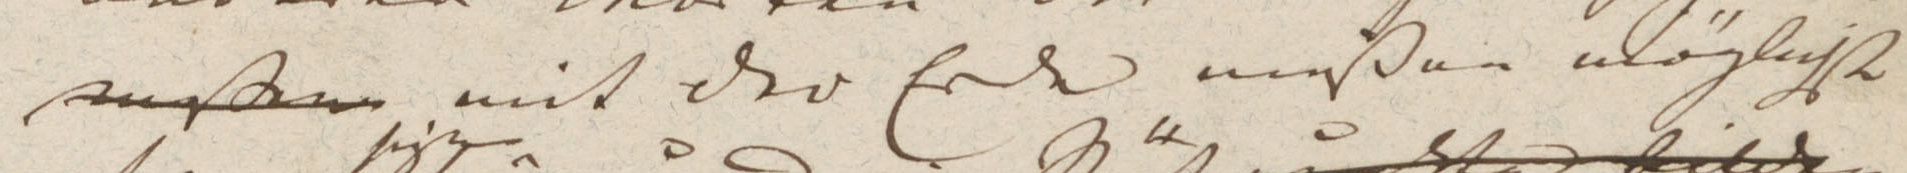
mussen mit der Erde müssen möglichst
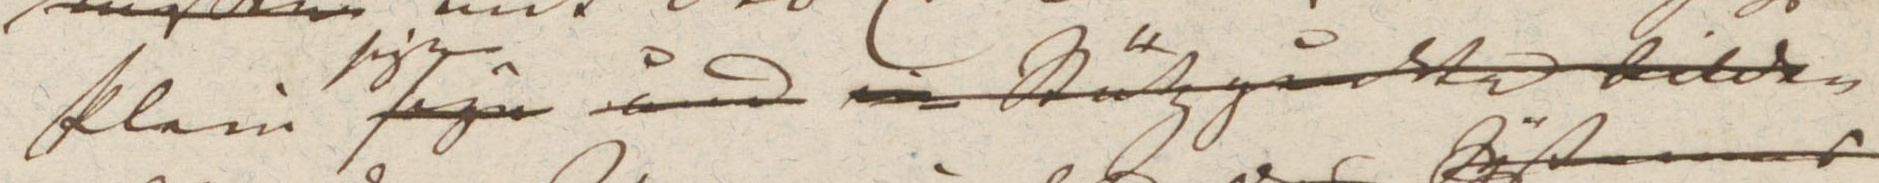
klein seyn seyn und in Stützpunkte bilden
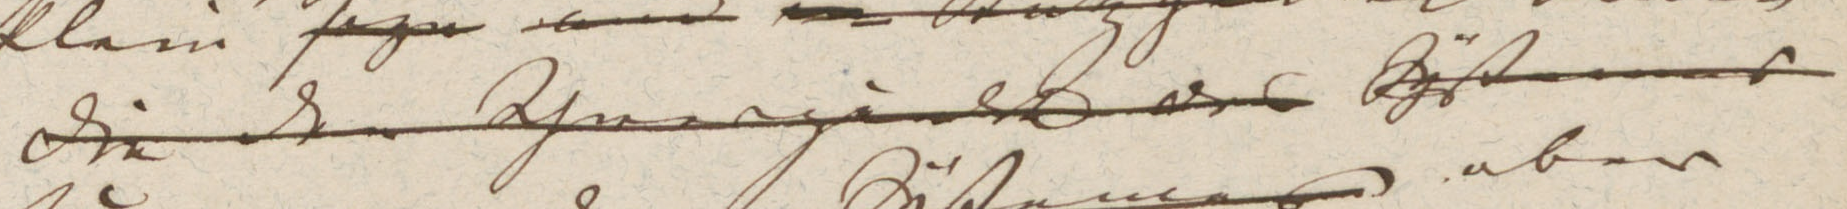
die den Schwerpunkt des Systemes
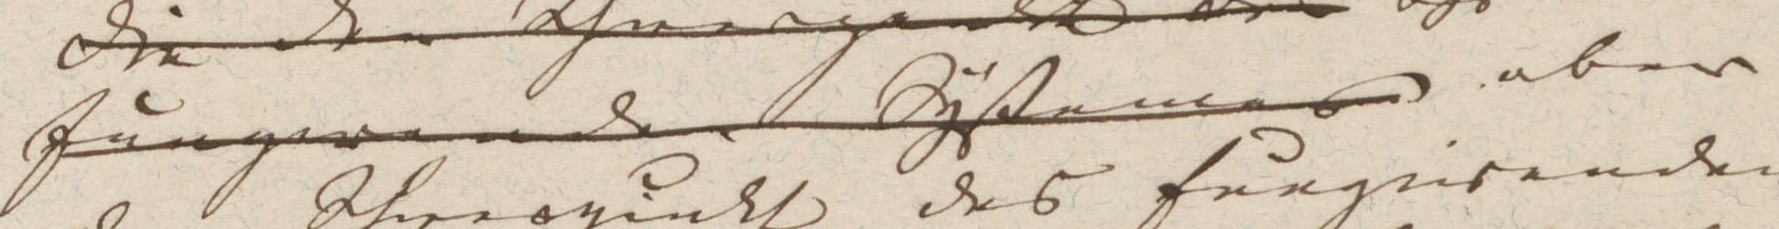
fungirenden Systemes aber
